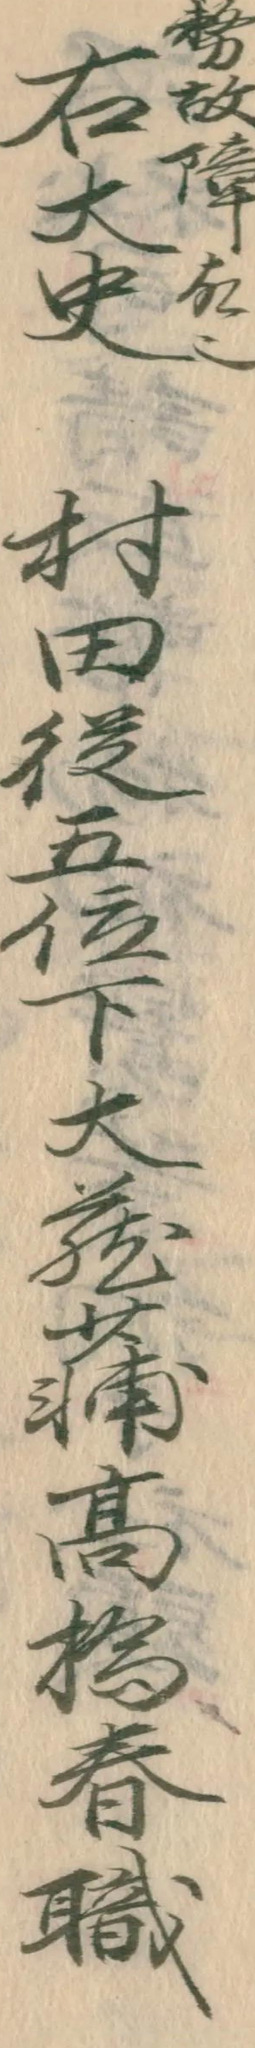右大史村田従五位下大蔵少輔高橋春職
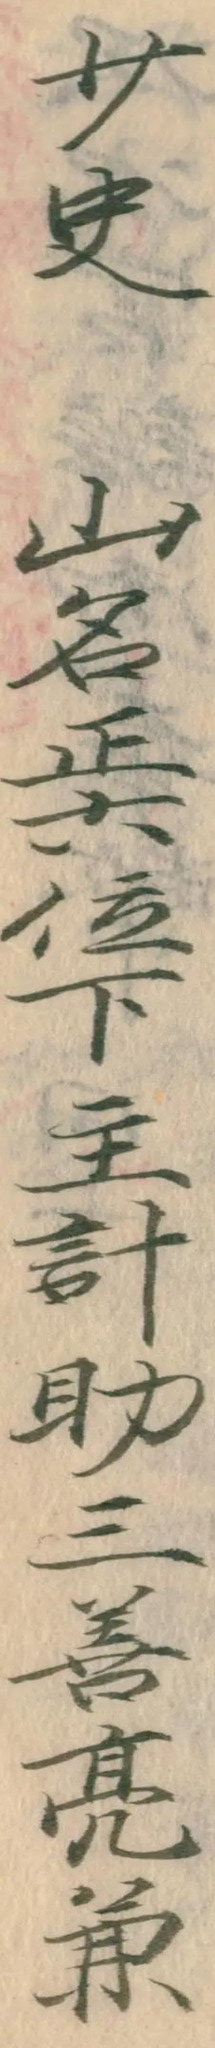少史山名正六位下主計助三善亮兼
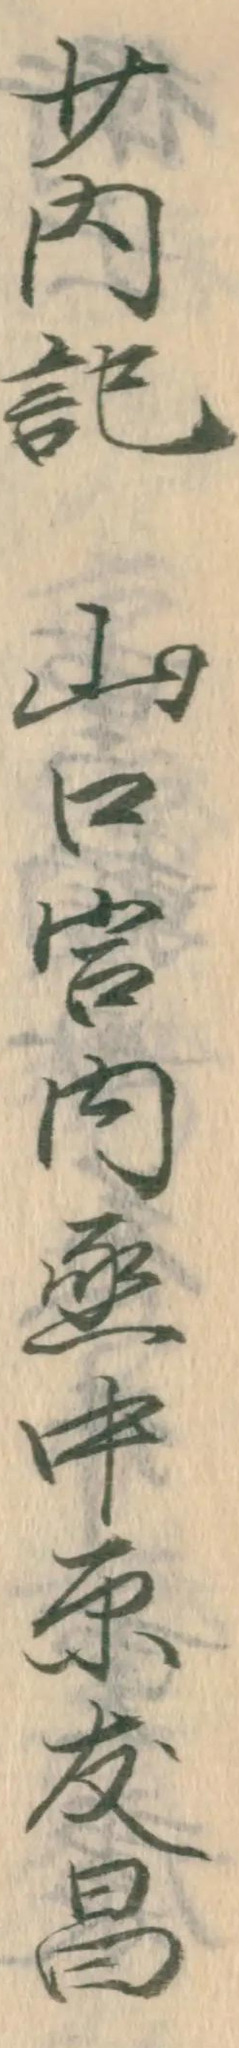少内記山口宮内丞中原友昌
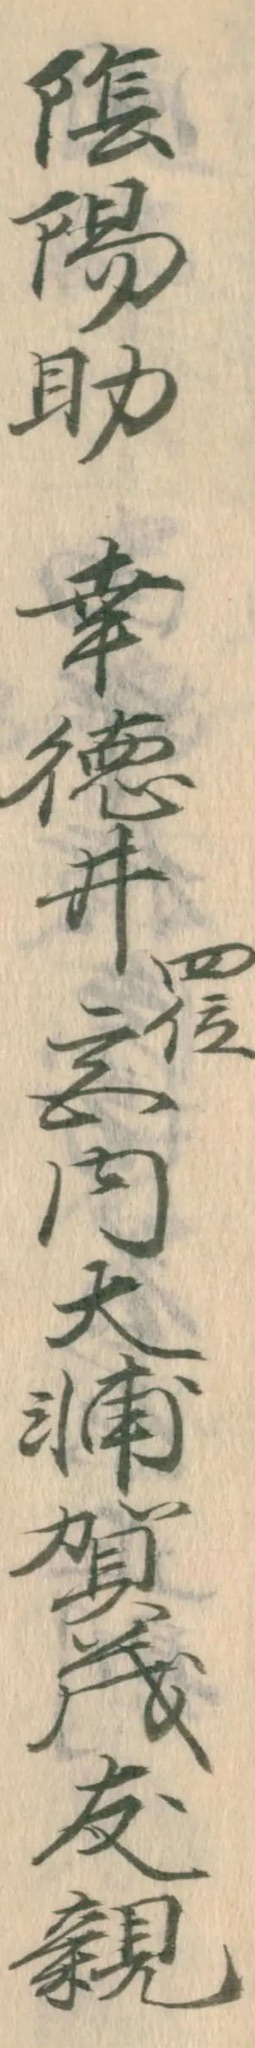陰陽助幸徳井宮内大輔賀茂友親
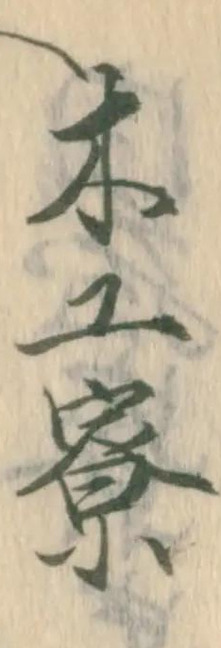(木工寮
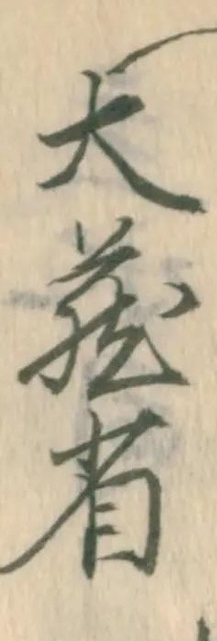(大蔵省
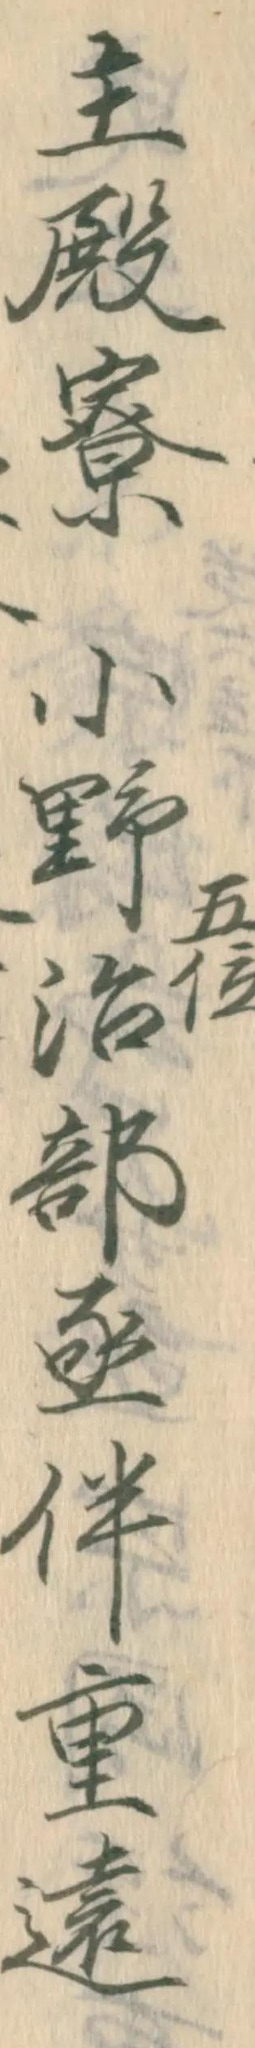主殿寮小野治部丞伴重遠
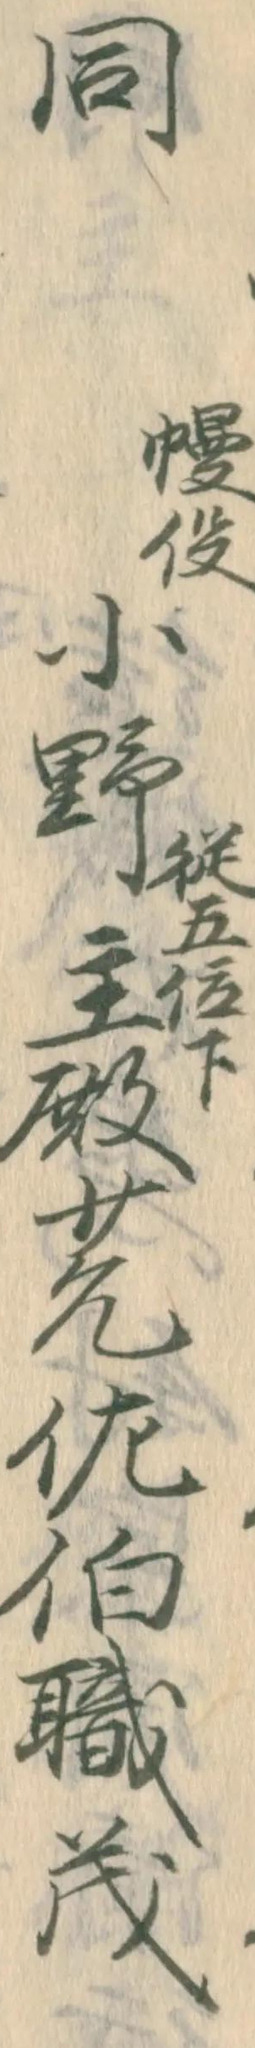同幔役小野主殿少允佐伯職茂
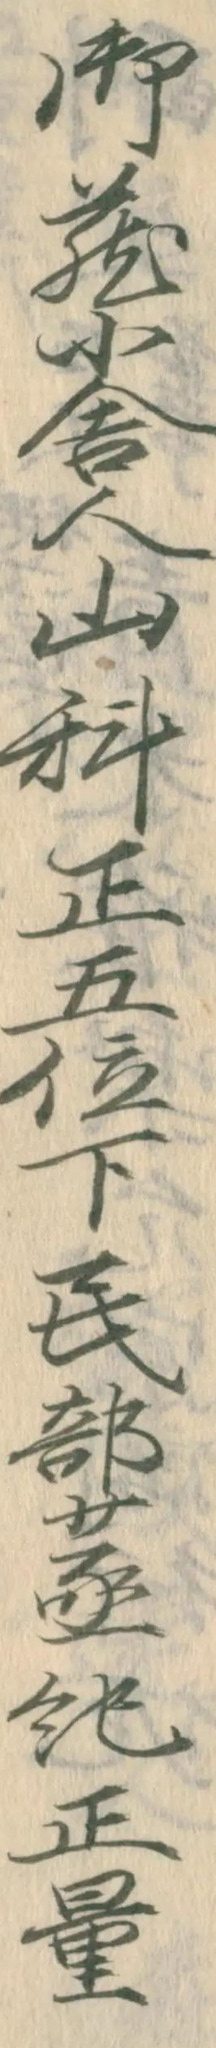御蔵小舎人山科正五位下民部少丞紀正量
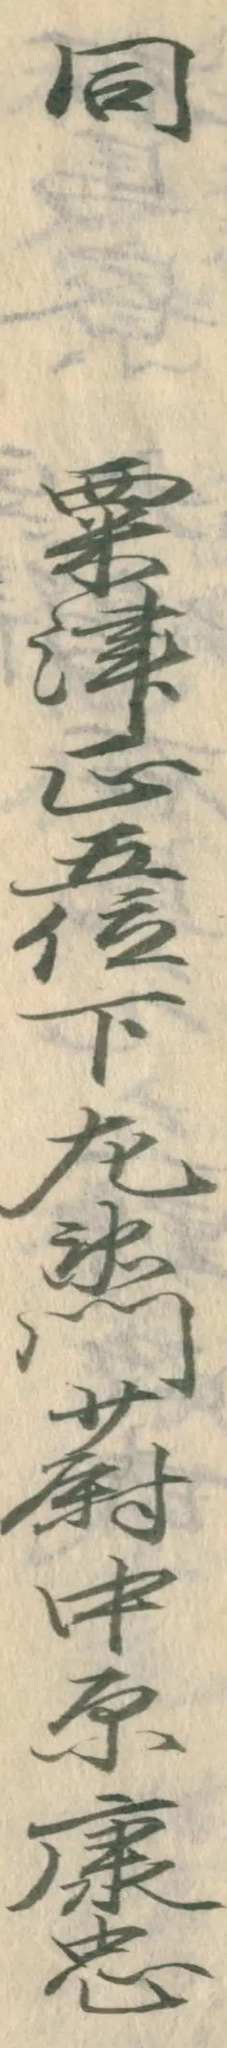同粟津正五位下左衛門少尉中原康忠
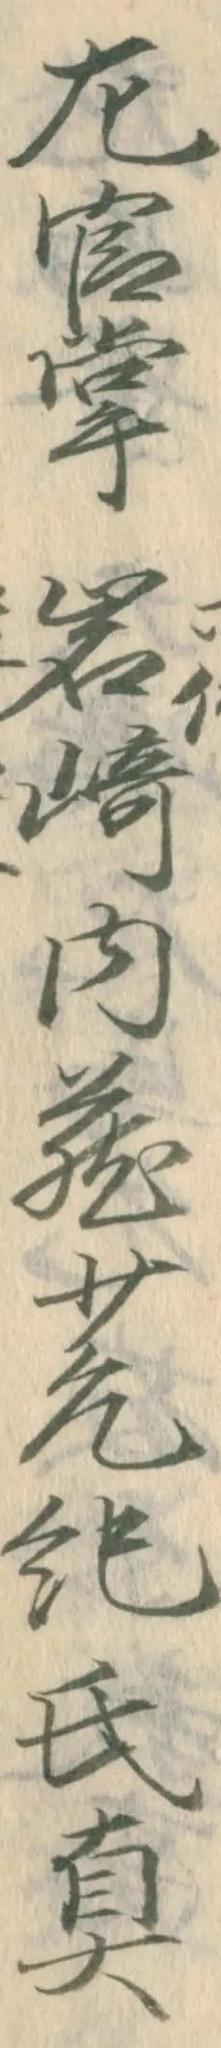左官掌岩崎内蔵少允紀氏真
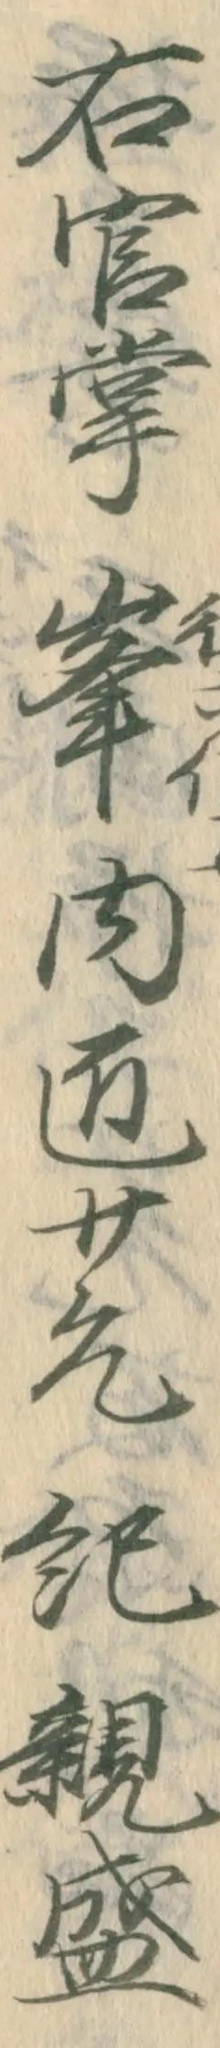右官掌峰内匠少允紀親盛

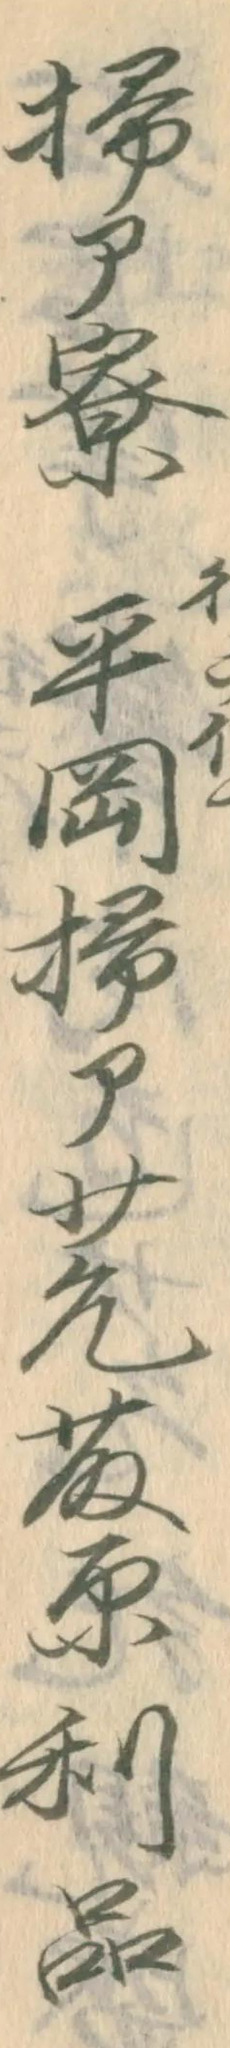掃部寮平岡掃部少允藤原利品
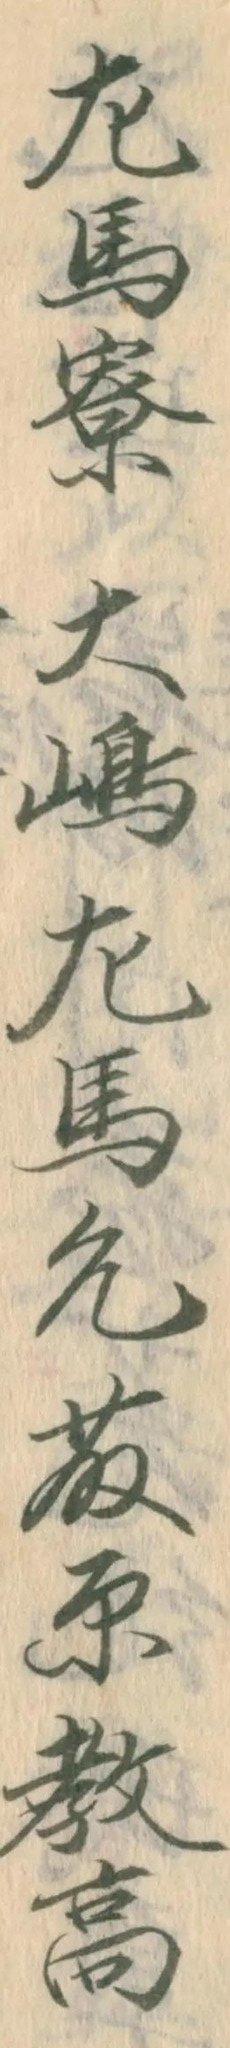左馬寮大嶋左馬允藤原教高
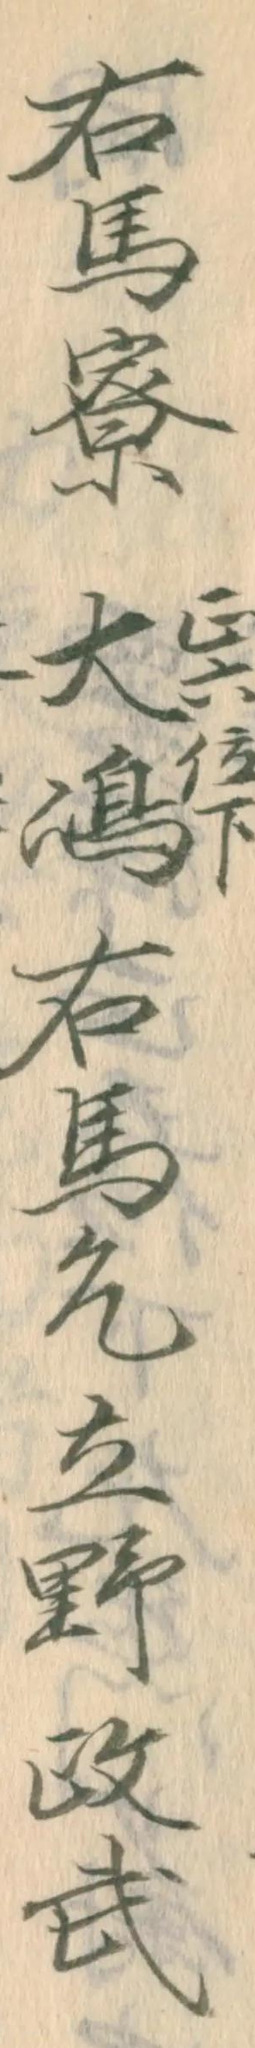右馬寮大嶋右馬允立野政武
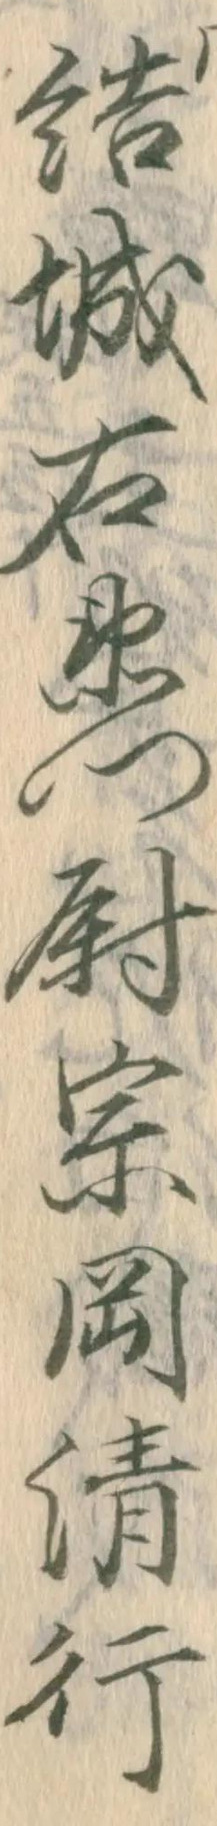同結城右衛門尉宗岡清行
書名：賀茂社記録. 第16冊
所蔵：国立国会図書館 National Diet Library, JAPAN
